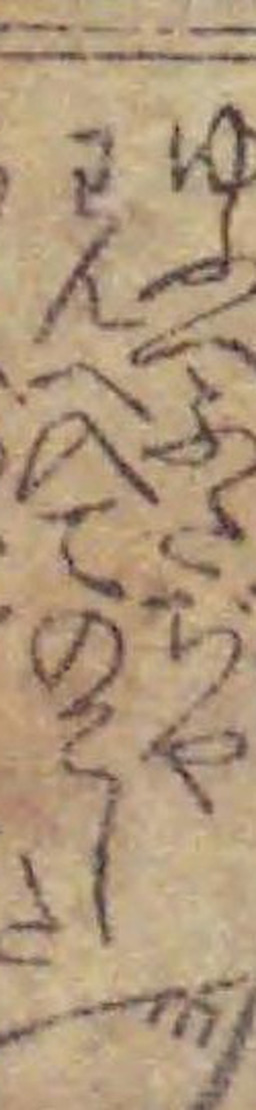わんへ入てのこし
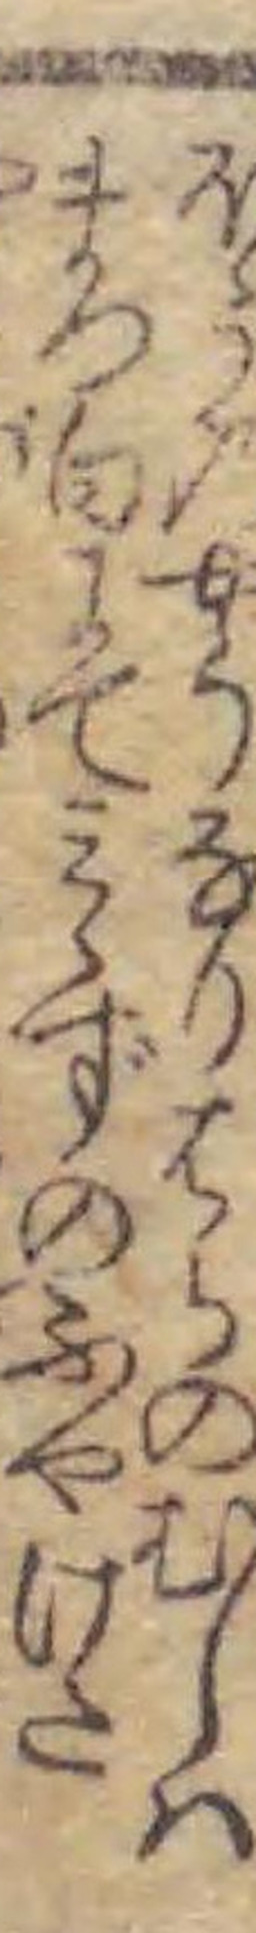まつ白にてみゝずのふやけた
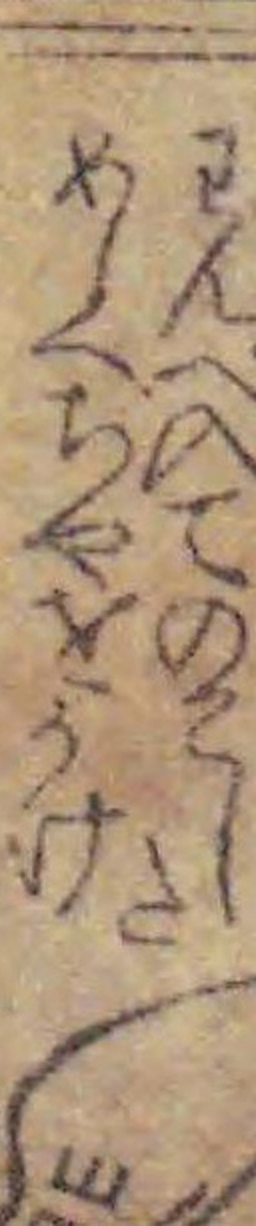めしへちやをかけ
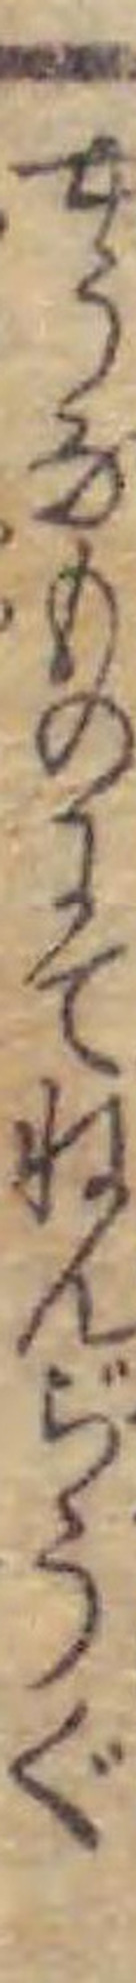やうなものにてねんぢうぐ
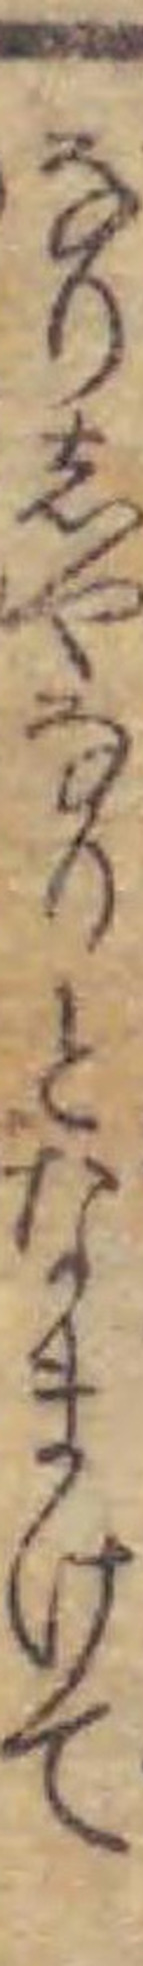なりしやなりとなまけて
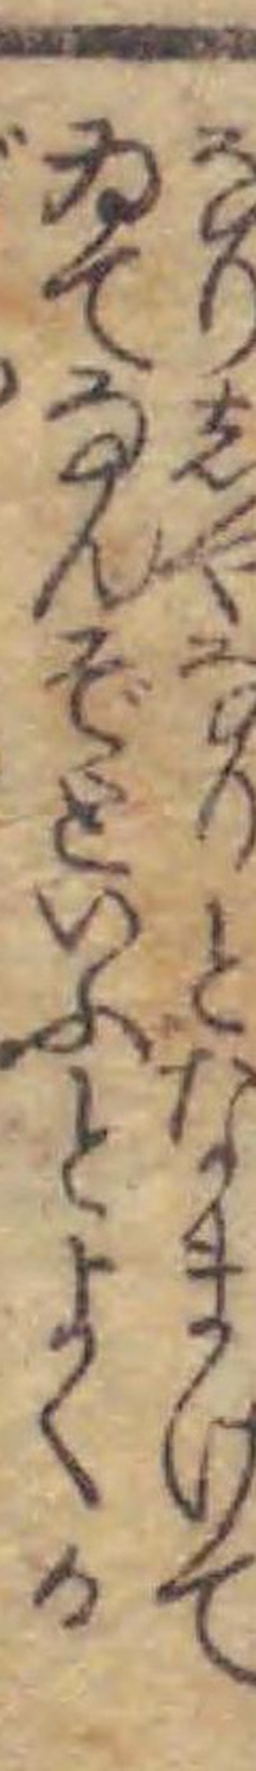ゐてなんぞといふとよくゐ
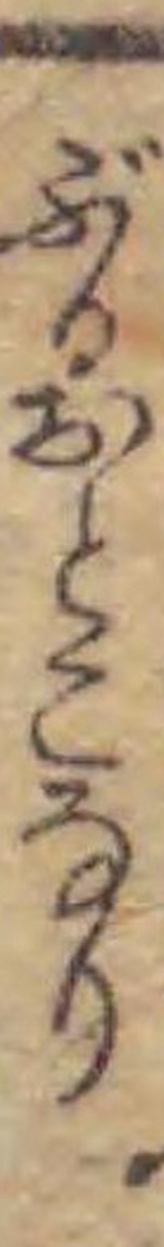ぶるおとこなり
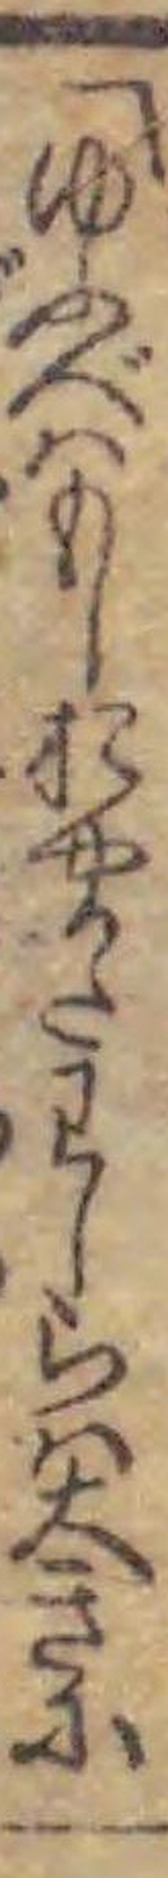〽ゆふべはもしおやかたわしらは大きに
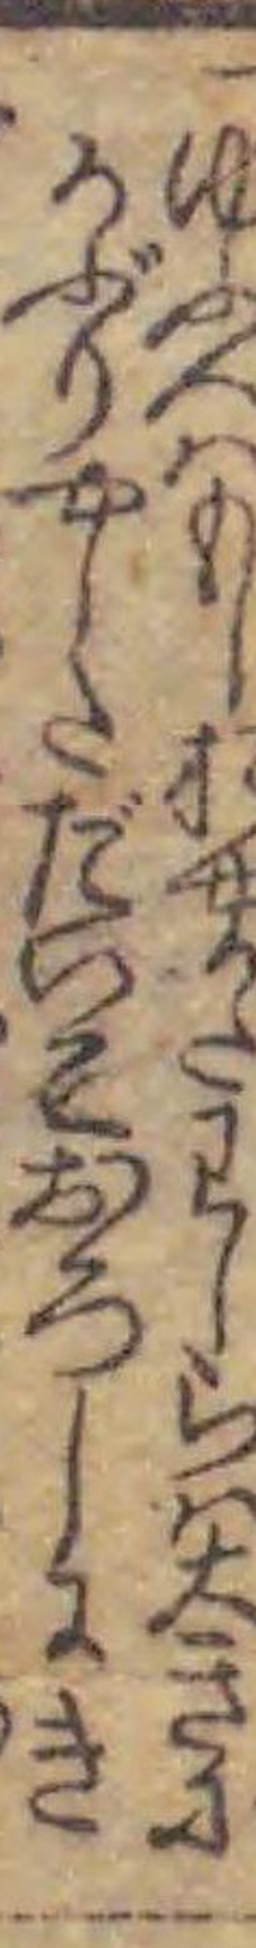かぶりやしただいこおろしにき
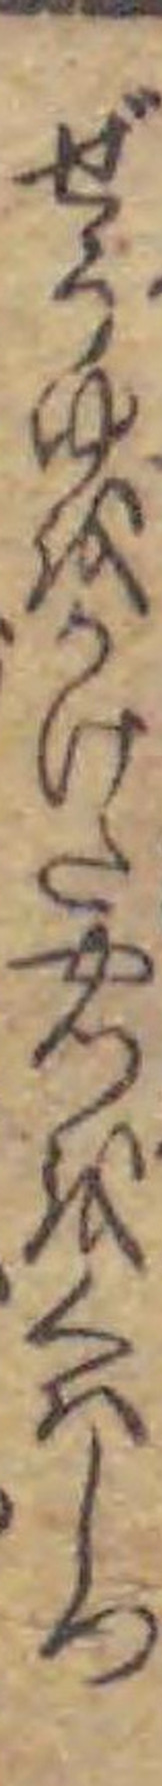ぜうゆをかけたやつをくはしつ
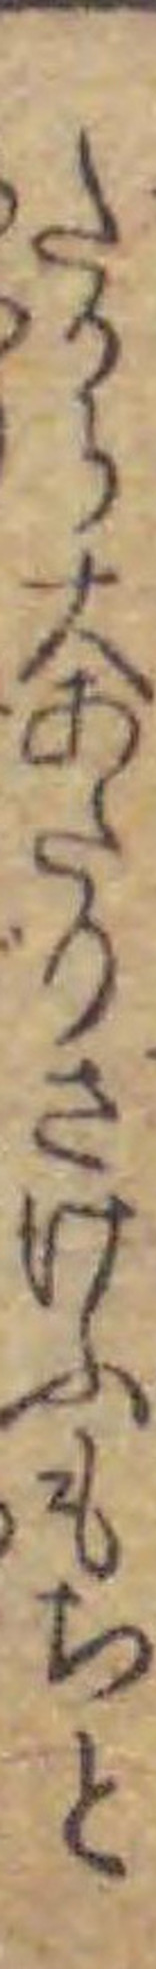たから大あたりさけふもちと
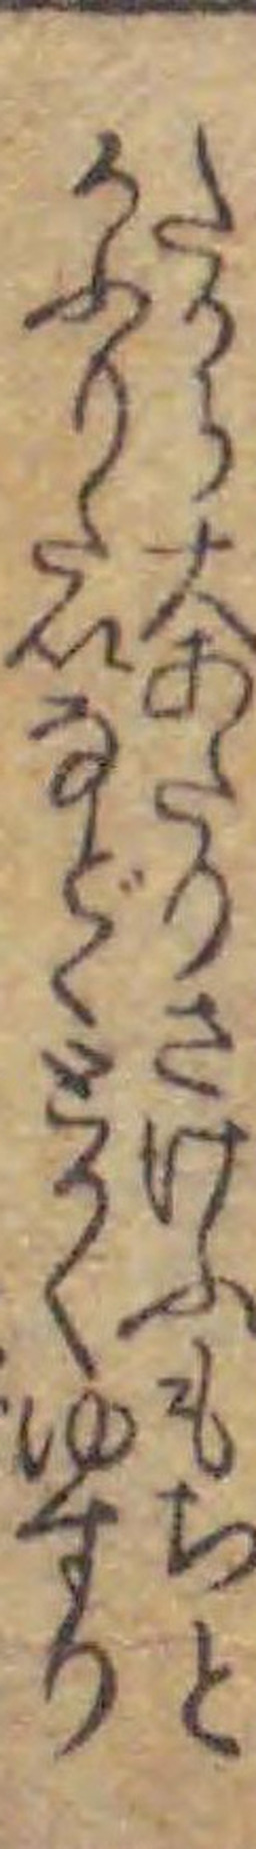かふりたいなどゝとかくゆすり
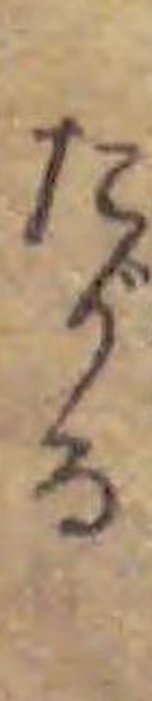たがる

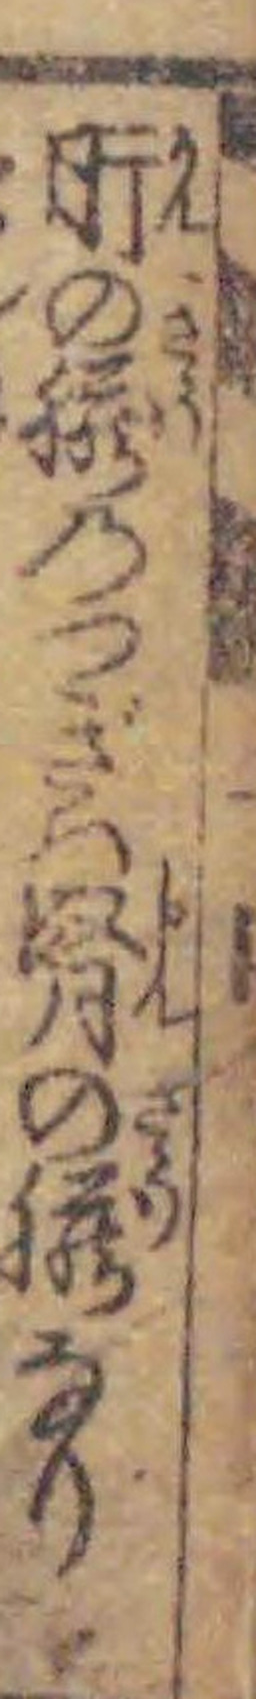肝の臓のつぎは腎の臓なり
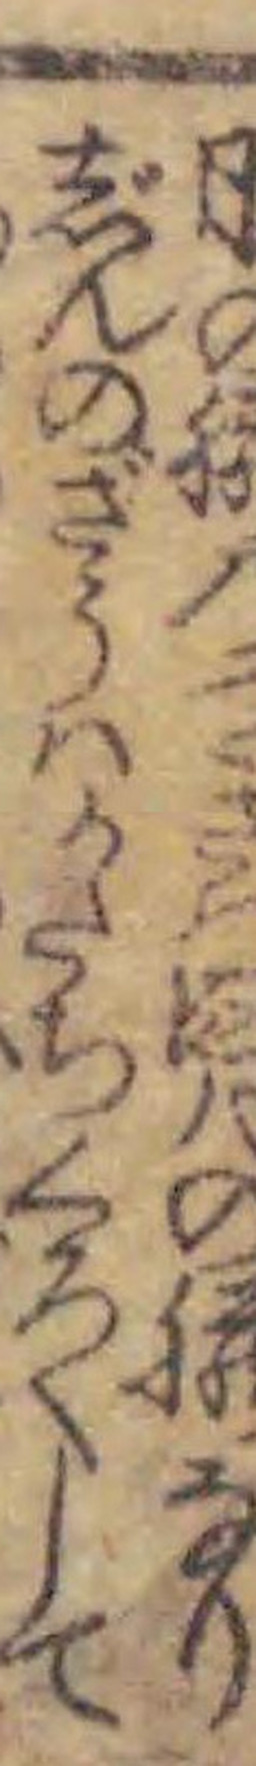じんのざうはかたちくろくして
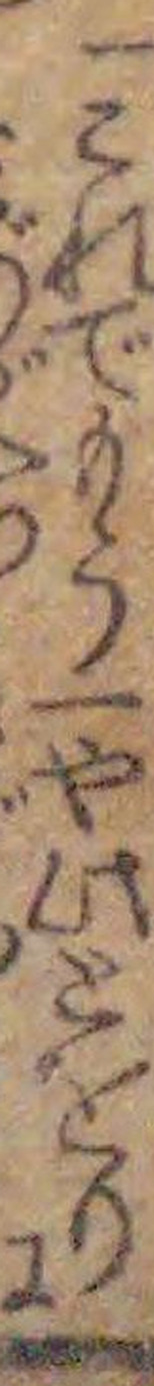〽これでもう一や此とをり
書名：十四傾城腹之内 : 3巻
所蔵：国立国会図書館 National Diet Library, JAPAN
